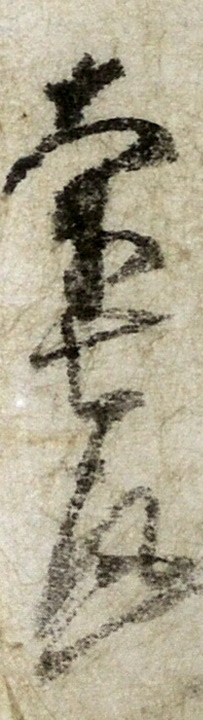大下七左衛門

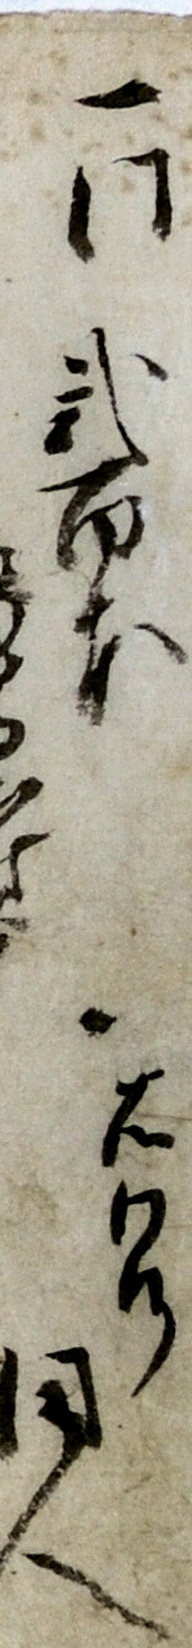一同弐百本右同断
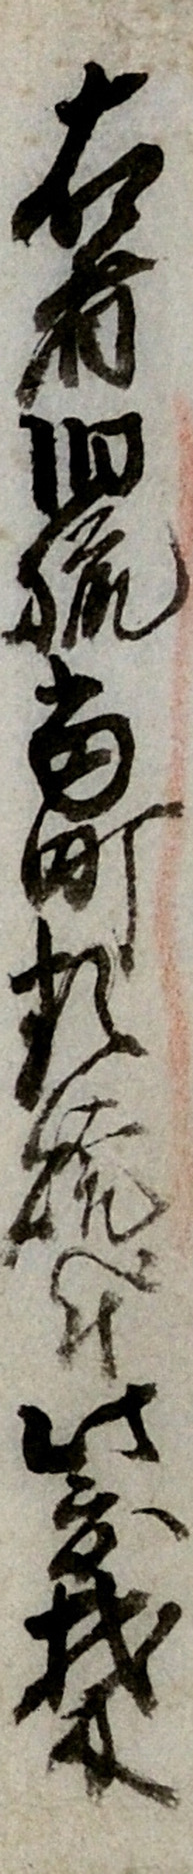右は旧臘当町類焼に付此度材木
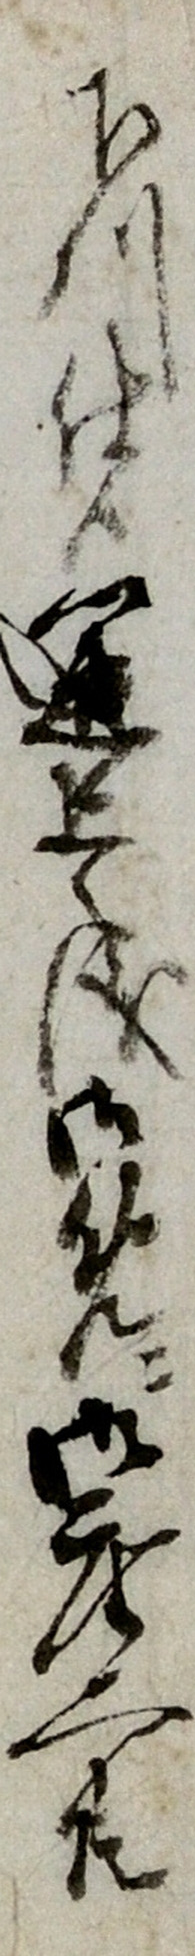下川仕候運上之儀御免ニ御座候へ共
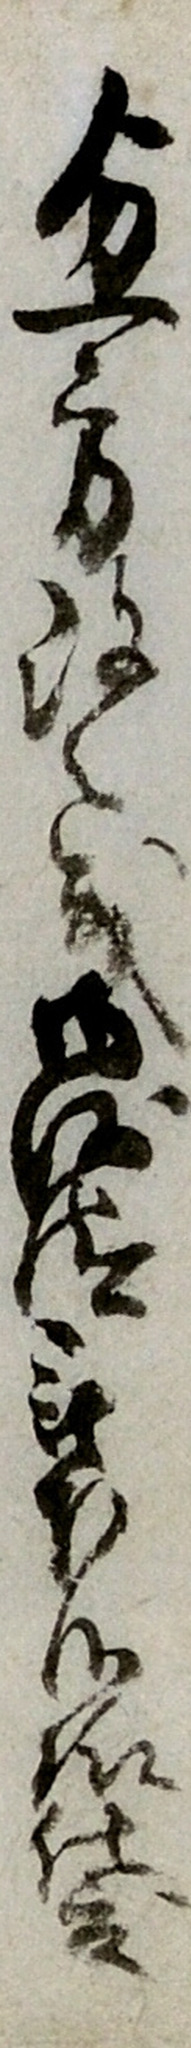分一方改之義御沙汰被下候様仕度
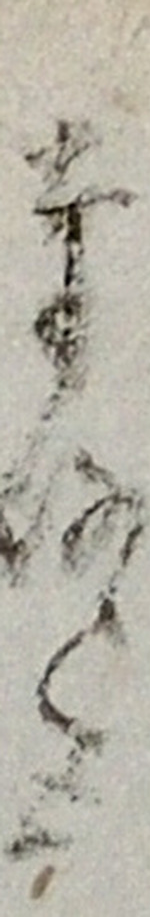奉存候以上
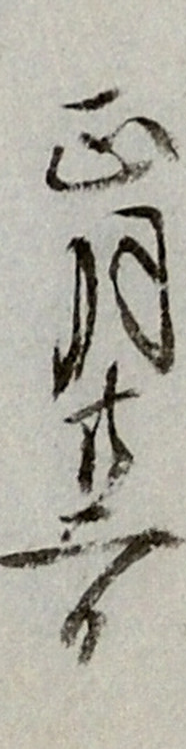正月廿三日
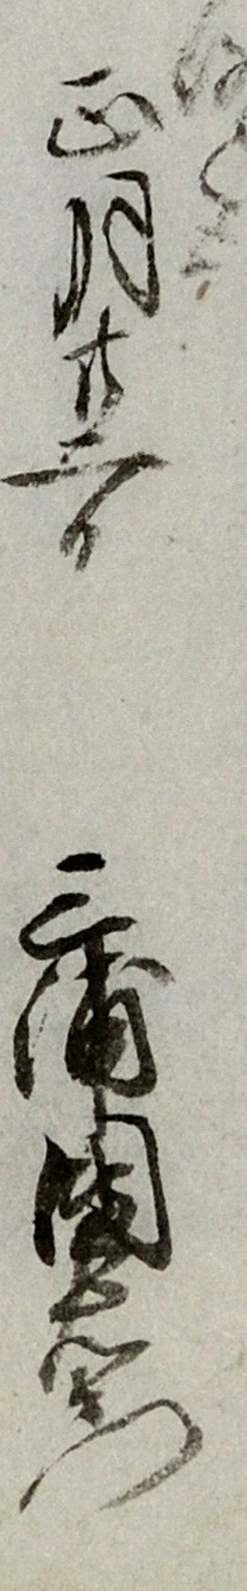正月廿二日三浦団右衛門
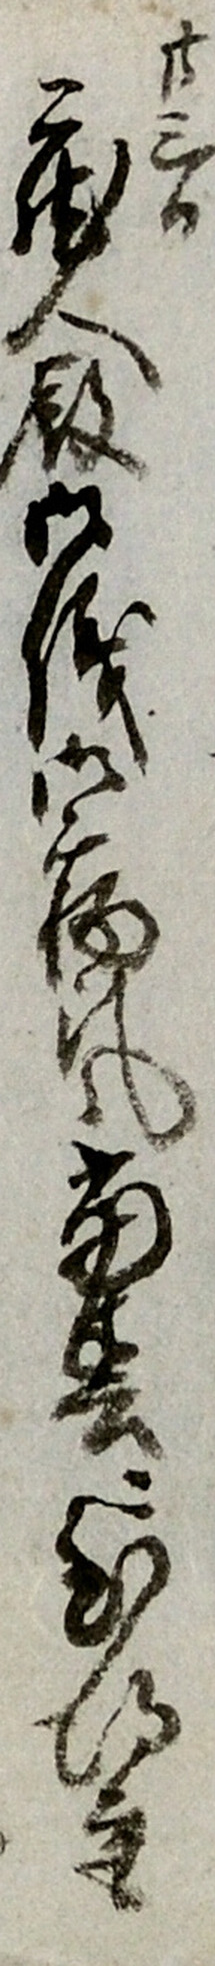蔵人殿御儀御病気当春に至得共
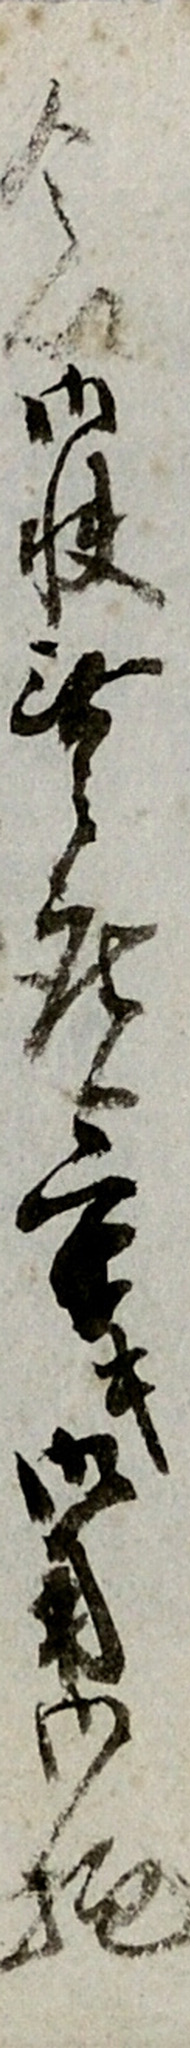今以御快無御座候重キ御用御抱
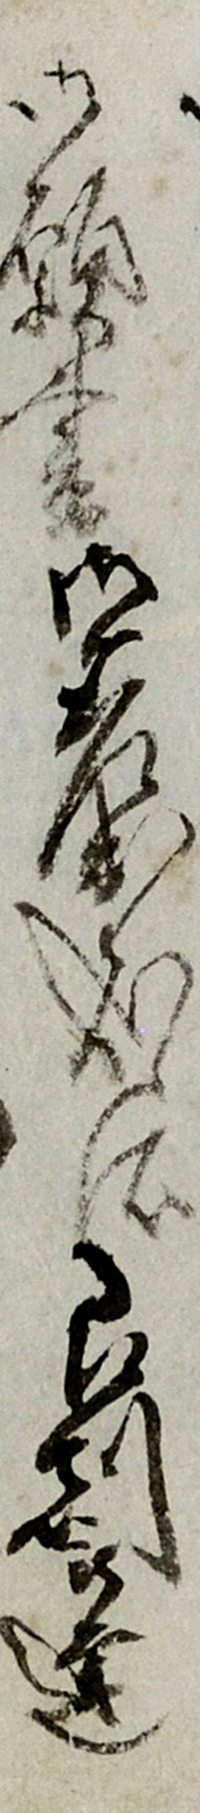御願書御差出被成候所即刻被達
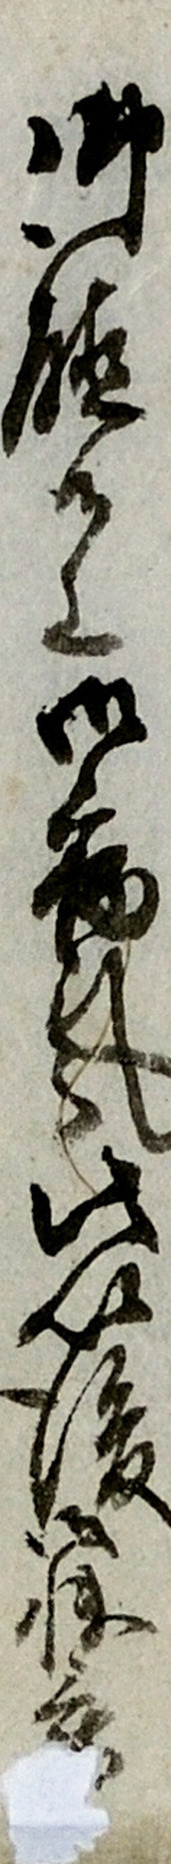御聴候上御病気此以後御快気
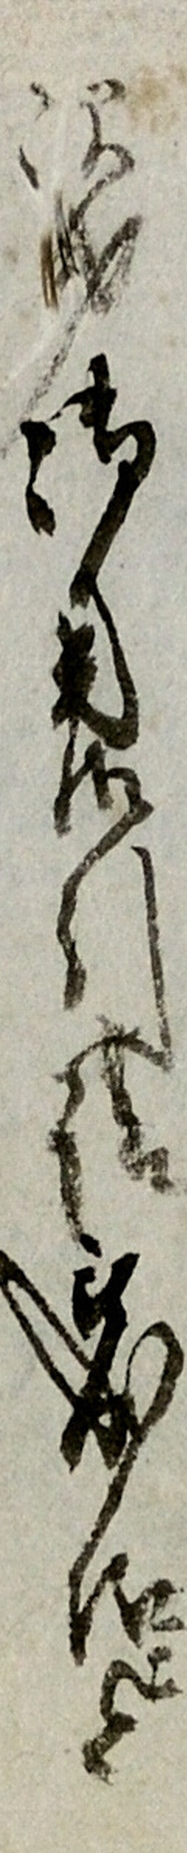次第御用御引請被成候様ニと
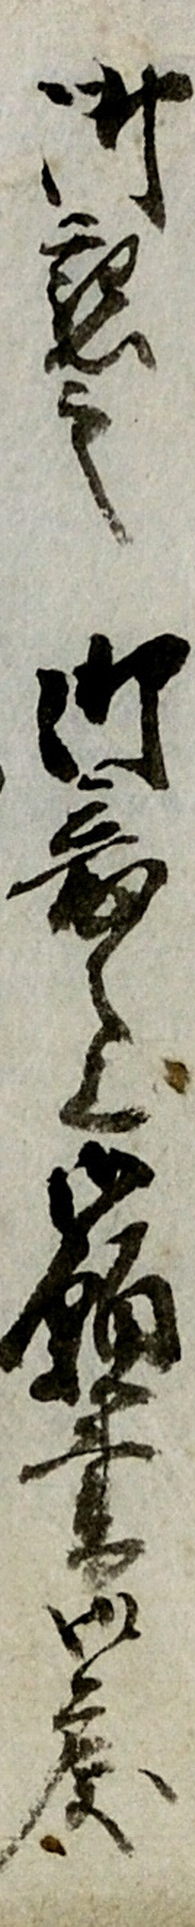御懇之御意之上御願書御戻
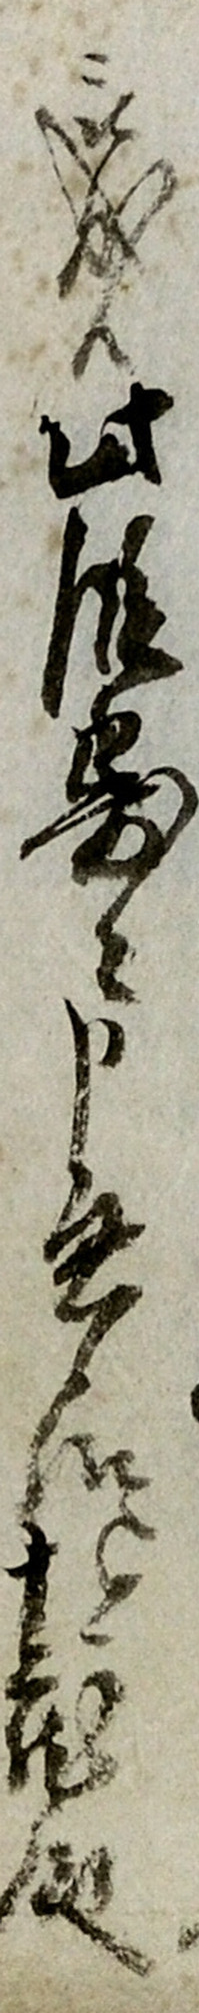被成候此段寄々申通候様ニと十蔵殿
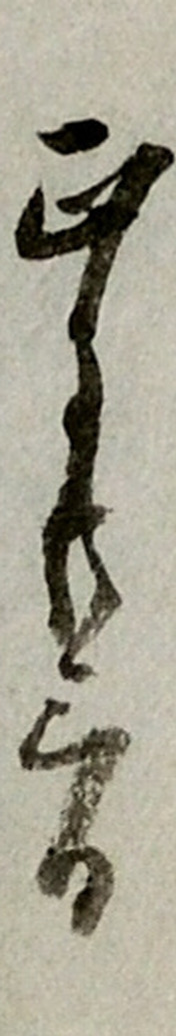正月廿三日
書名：分一方諸事御用留帳
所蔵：伊那市立高遠町図書館・合同会社AMANE
